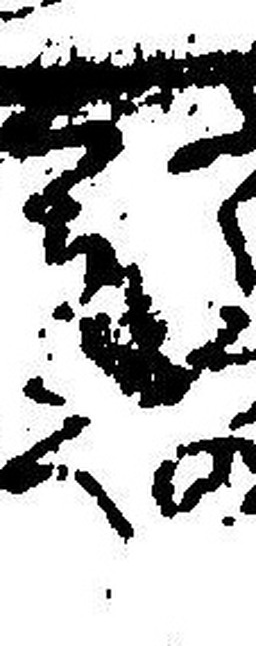くちさへ
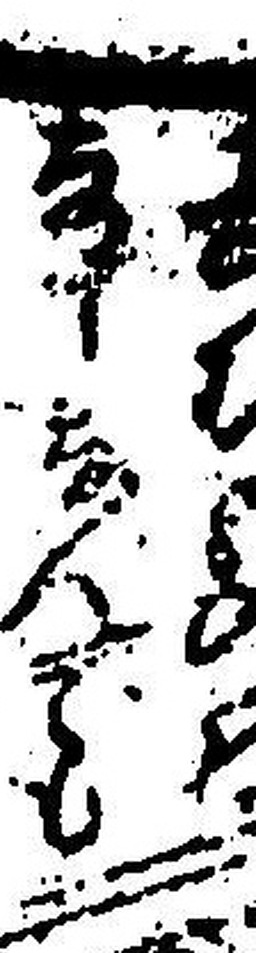なしなんでも
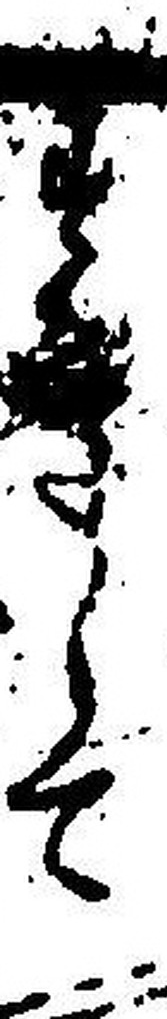すにして
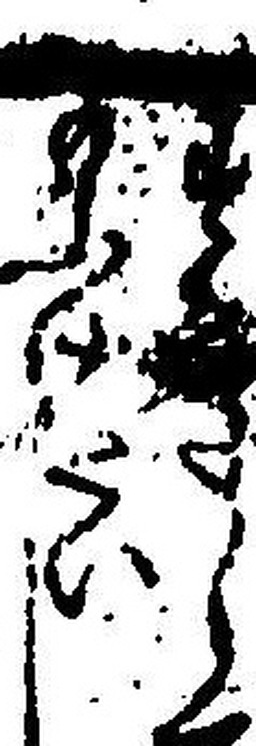もふけたい
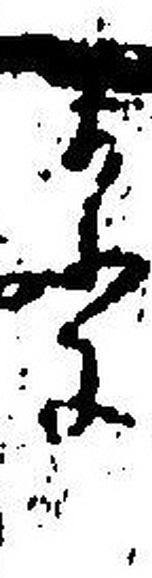よふに
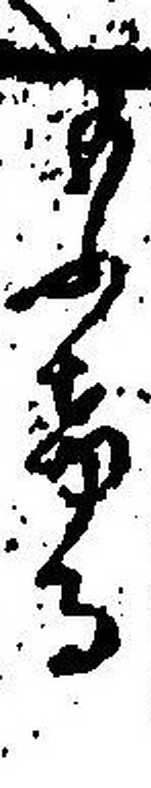もふける

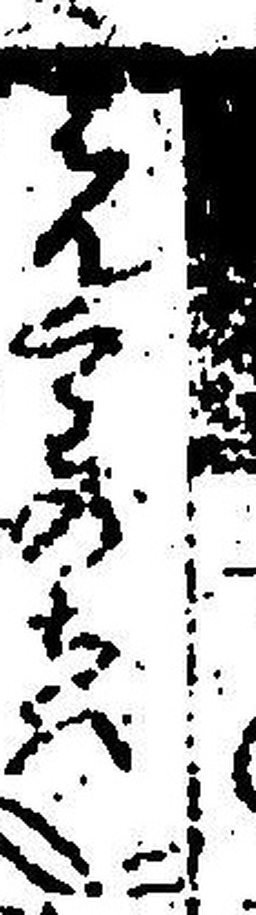はんくわのちは
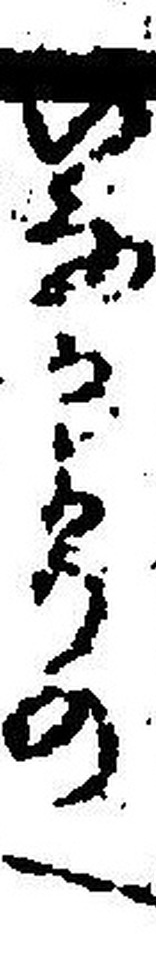いなかよりの
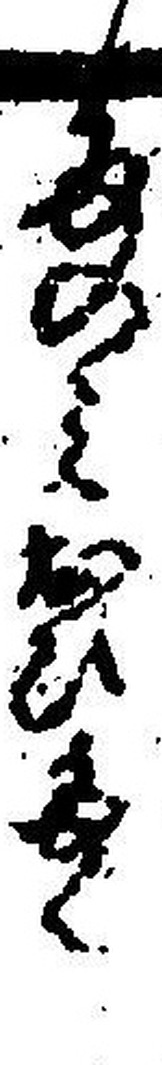たのみおひたゝ
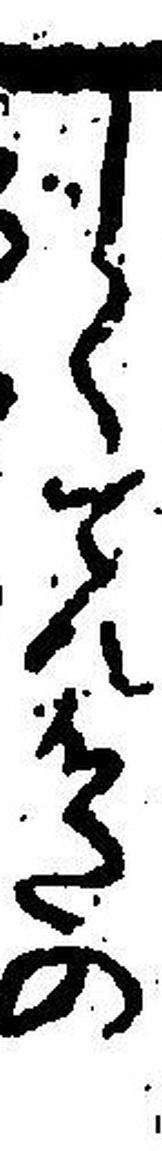しくてんはたの
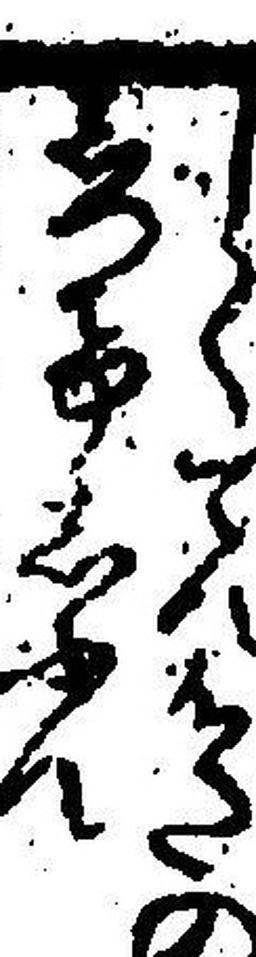しつけしふん
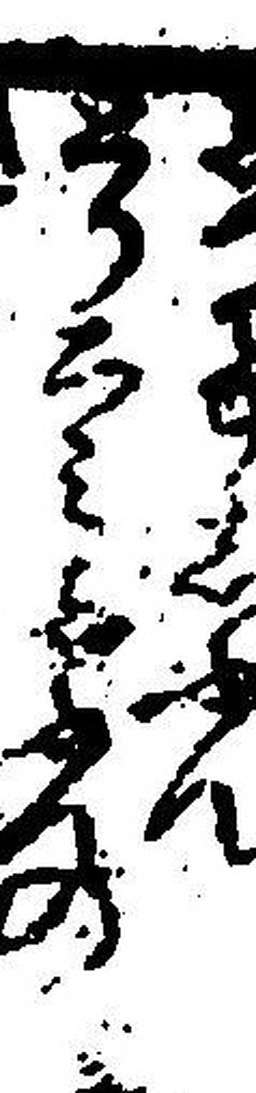とりこみしふんの
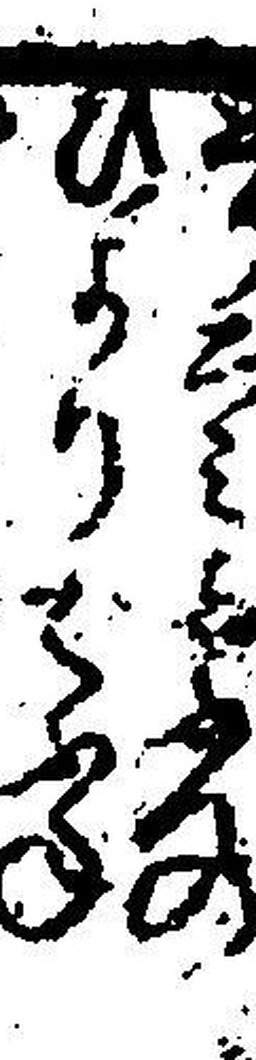ひよりてふね
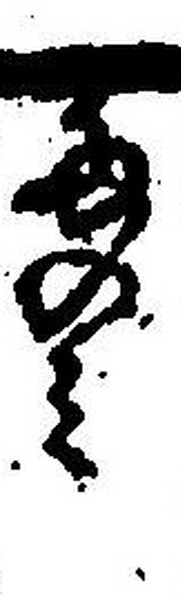たのみ
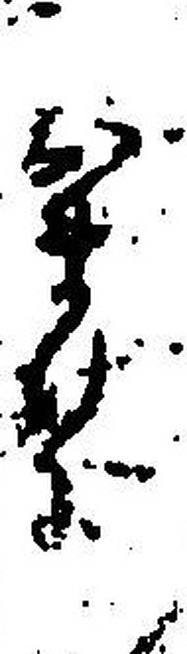おまけに
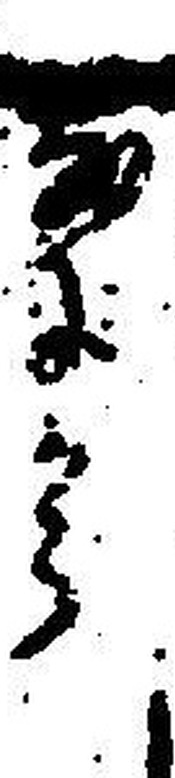なにから
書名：天竺儲之筋 / 市場通笑作
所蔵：東京大学総合図書館 General Library in the University of Tokyo, JAPAN
